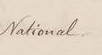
National.
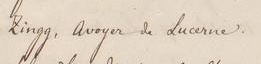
Zingg, Avoyer de Lucerne.
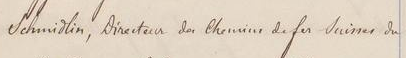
Schmidlin, Directeur des Chemins de fer Suisses du
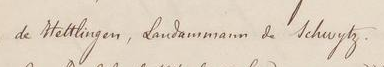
de Hettlingen, Landammann de Schwytz.
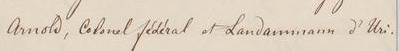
Arnold, Colonel fédéral et Landammann d'Uri.
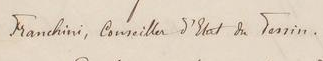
Franchini, Conseiller d'Etat du Tessin.
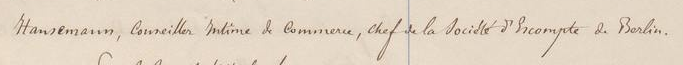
Hansemann, Conseiller Intime de Commerce, chef de la Société d'Escompte de Berlin.
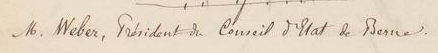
M. Weber, Président du Conseil d'Etat de Berne.
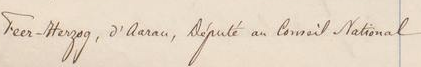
Feer-Herzog, d'Aarau, Député au Conseil National
